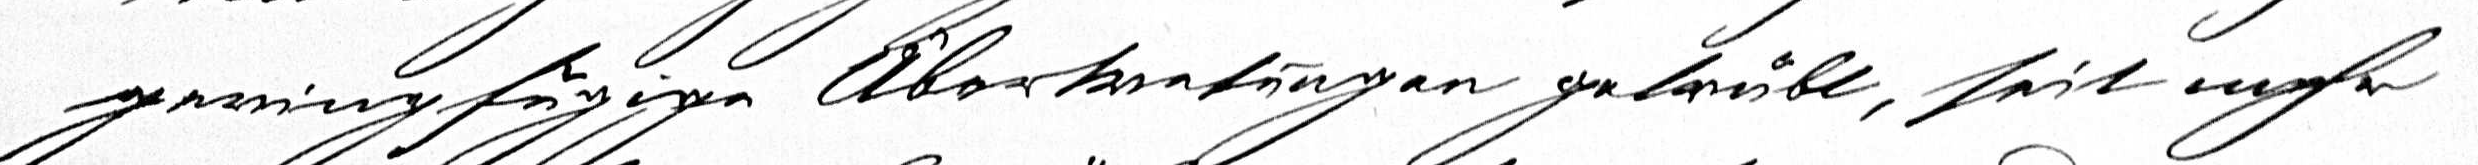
geringfügige Übertretungen getrübt, seit mehr
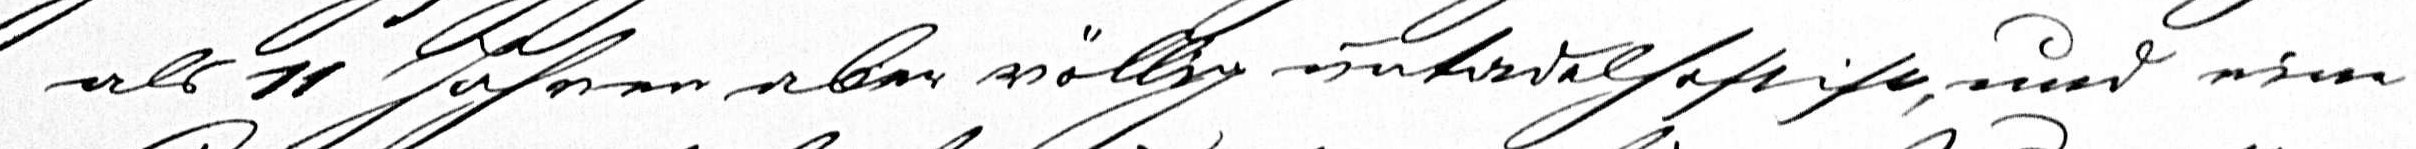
als 11 Jahren aber völlig untadelhaft ist, und eine
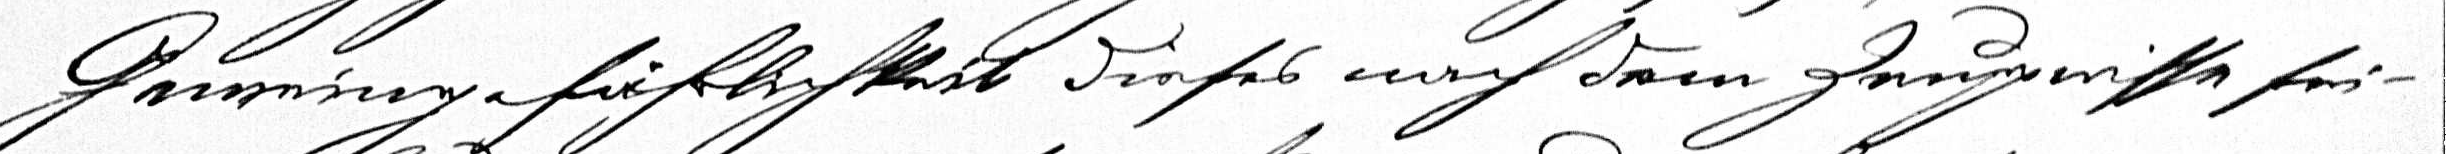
Gemeingefährlichkeit dieses nach dem Zeugnisse sei¬
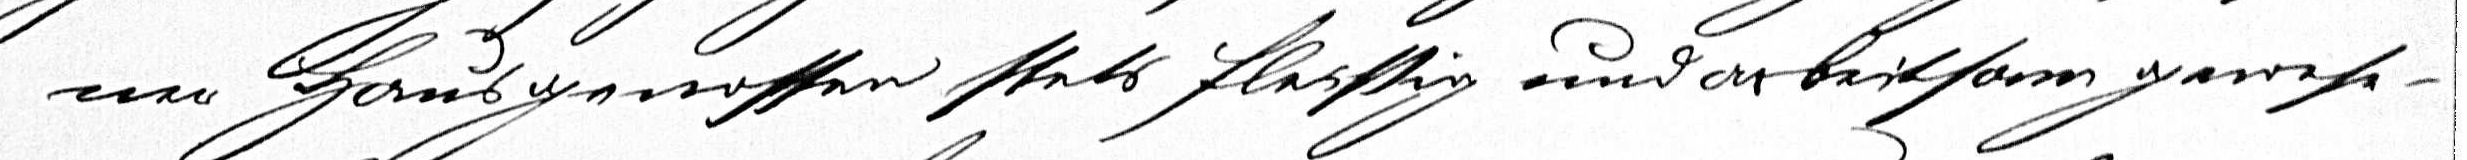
ner Hausgenossen stets fleißig und arbeitsame gewese¬
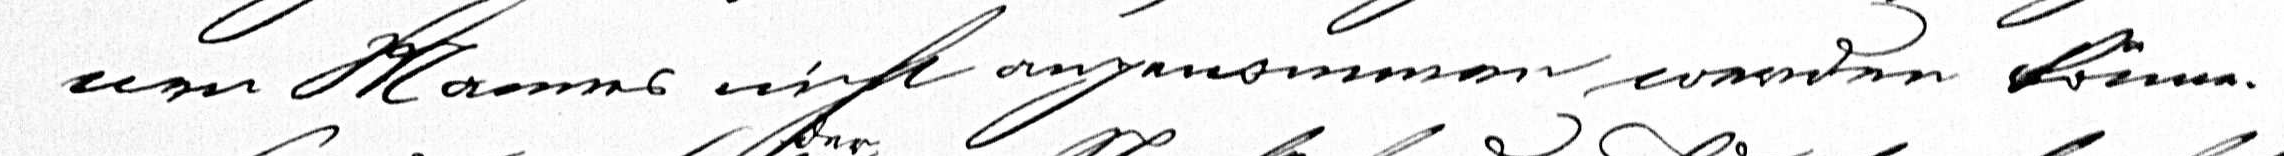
nen Mannes nicht angenommen werden könne.
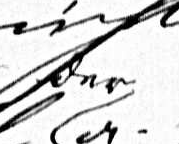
der
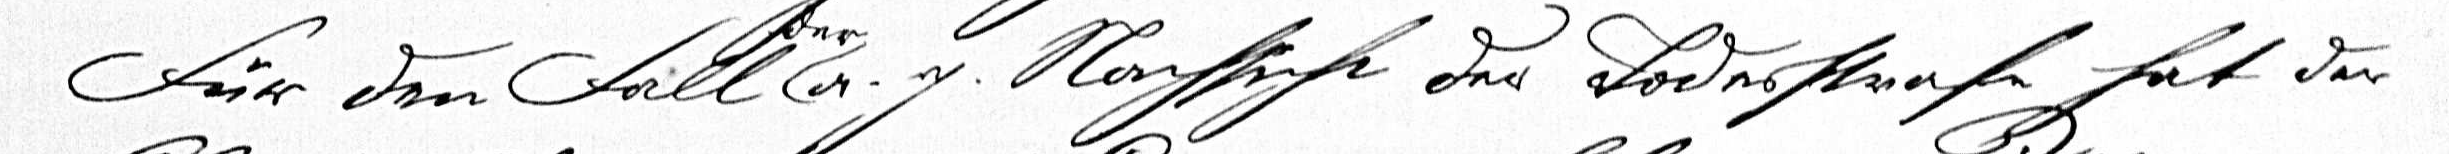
Für den Fall a.g. Nachsicht des Todesstrafe hat der
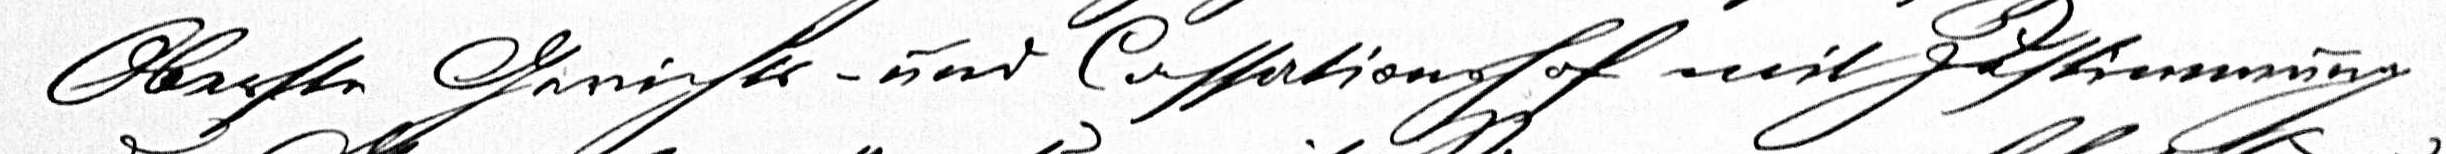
Oberste Gerichts- und Cassationshof mit Zustimmung
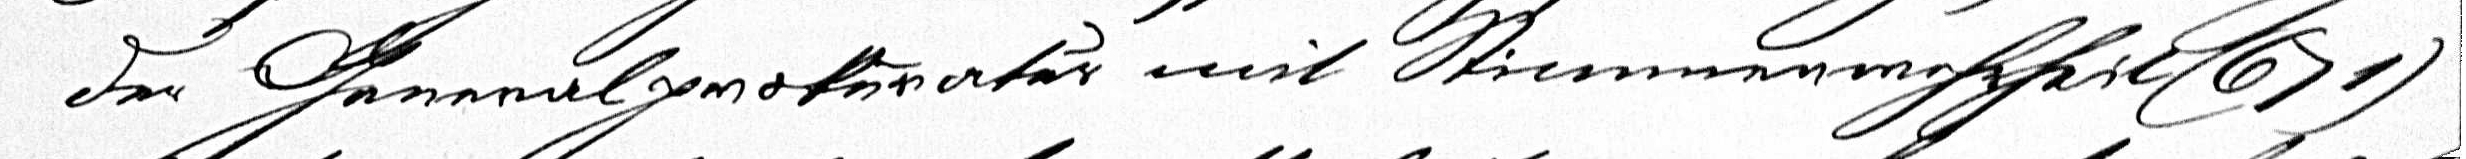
der Generalprokuratur mit Simmenmehrheit (6>1)
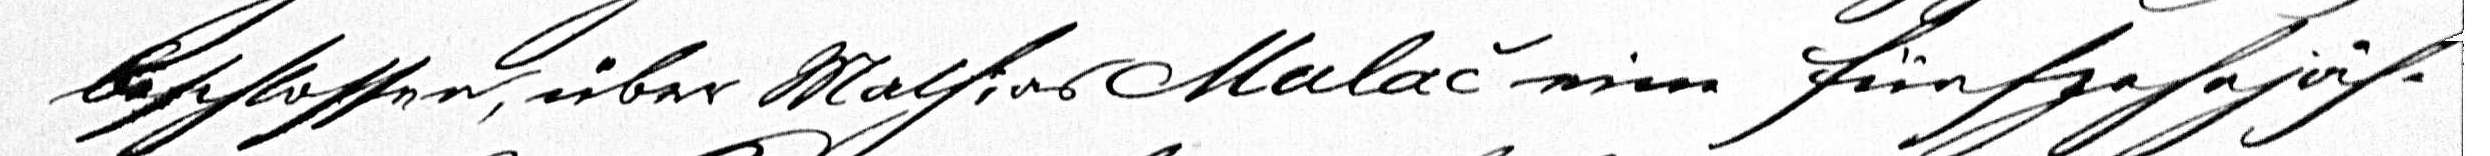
beschlossen, über Mathias Mulač eine fünfzehnjäh¬
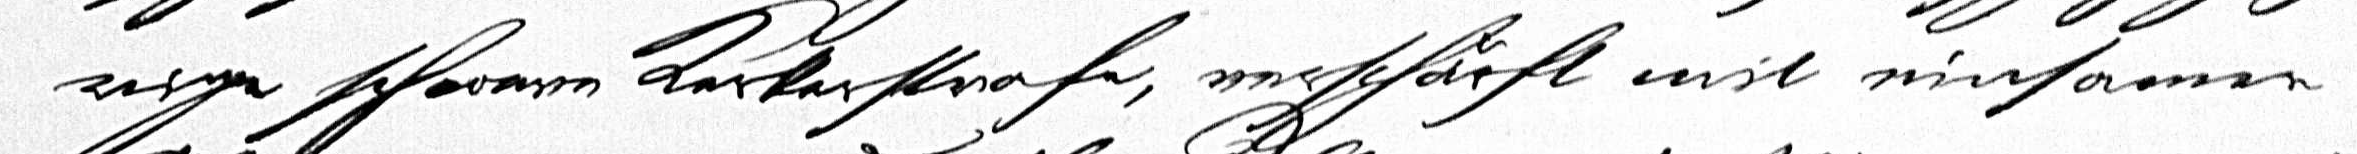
rige schweren Kerkerstrafe, verschärft mit einsamen
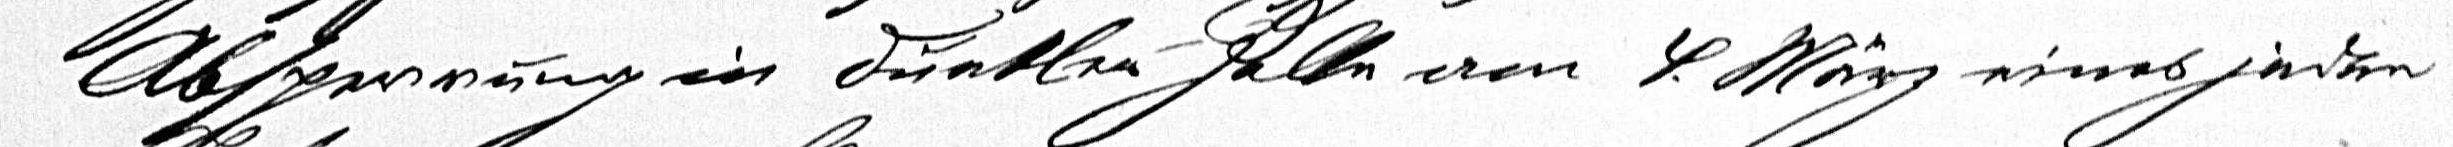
Absperrung in dunkler Zelle am 4. März eines jeden
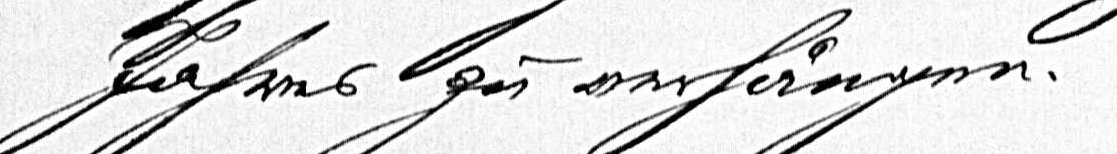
Jahres zu verhängen.
